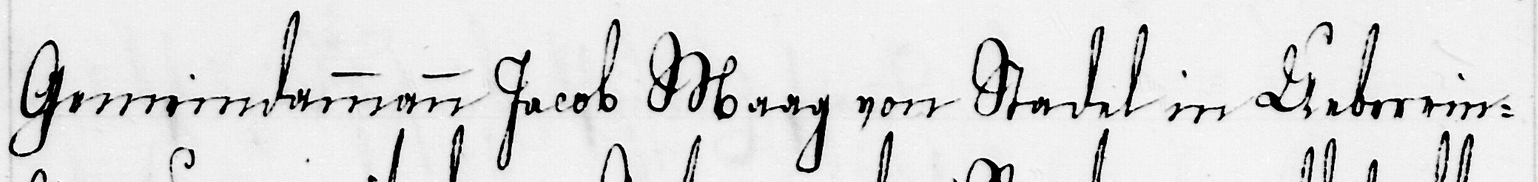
Gemeindammann Jacob Maag von Stadel in Ueberein¬
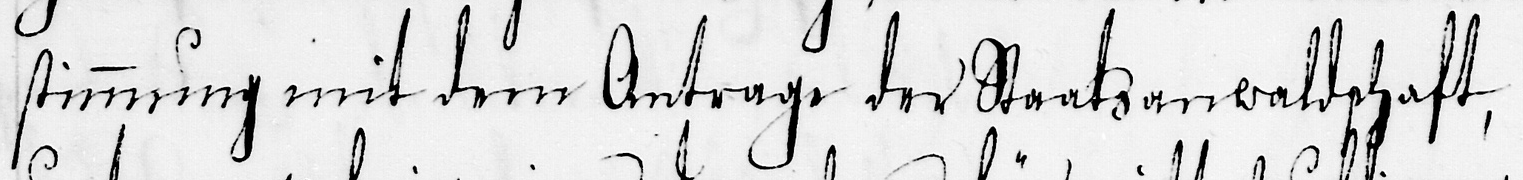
stimmung mit dem Antrage der Staatsanwaldschaft,
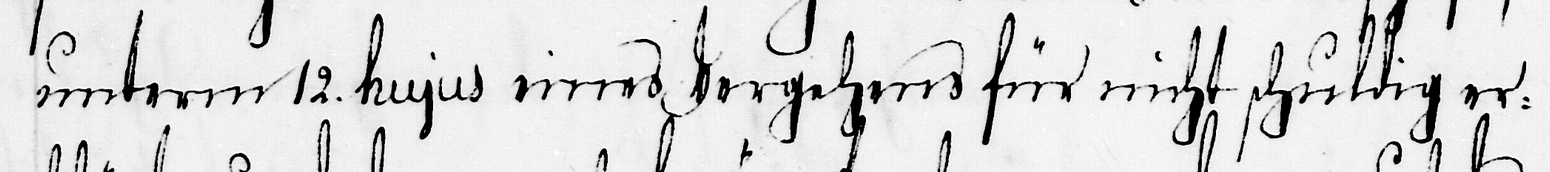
unterm 12. hujus eines Vergehens für nicht schuldig er¬
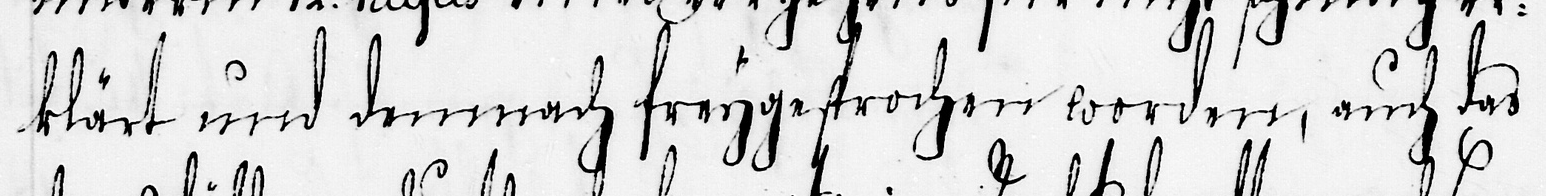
klärt und demnach freygesprochen worden, auch das
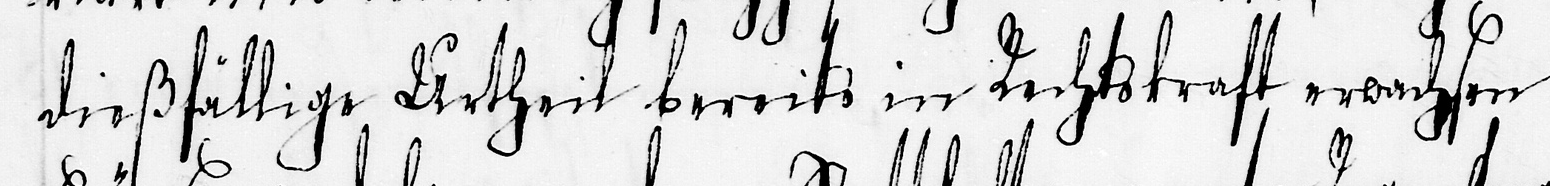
dießfällige Urtheil bereits in Rechtskraft erwachsen
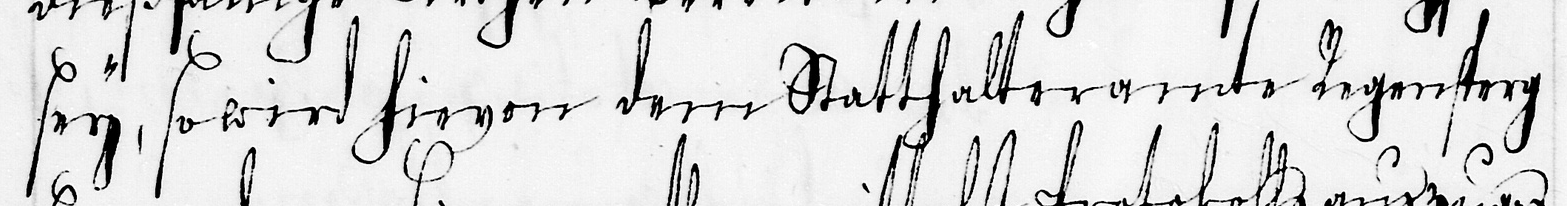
sey, so wird hievon dem Statthalteramte Regensperg
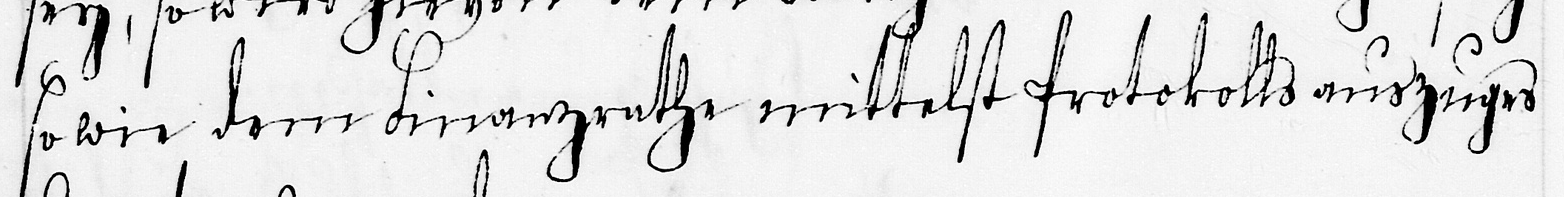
sowie dem Finanzrathe mittelst Protokollsauszuges
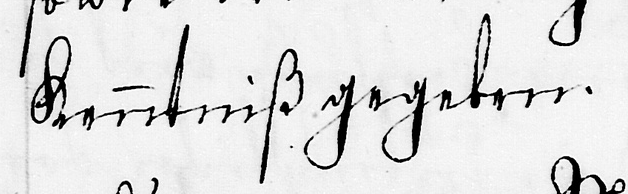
Kenntniß gegeben.
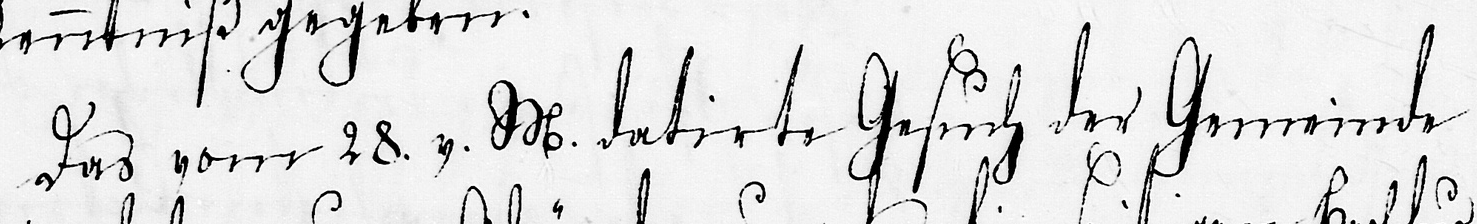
Das vom 28. v. M. datirte Gesuch der Gemeinde
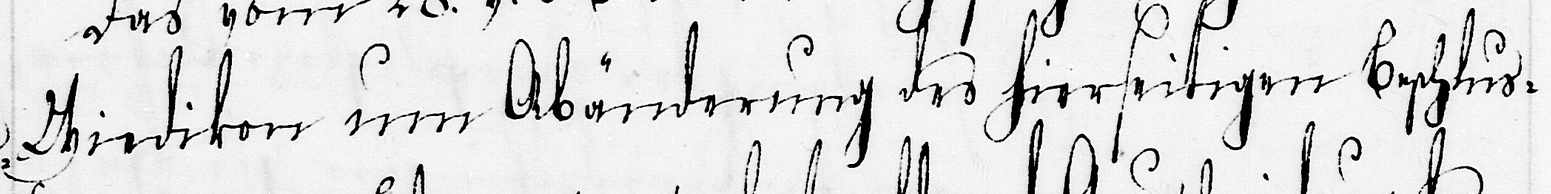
Wiedikon um Abänderung des hierseitigen Beschlu¬
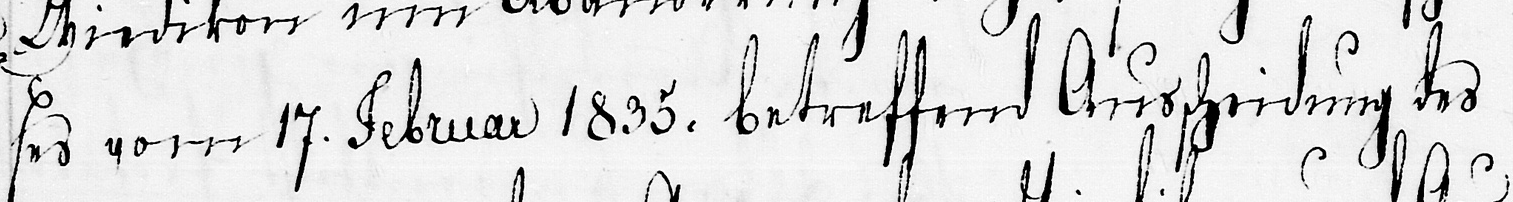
ßes vom 17. Februar 1835. betreffend Ausscheidung des
